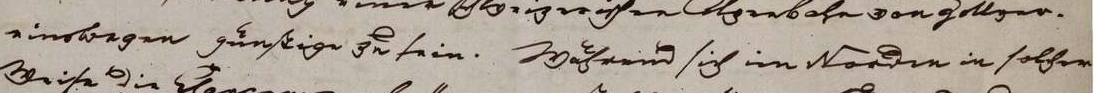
einswegen günstige zu sein. Während sich im Norden in solcher
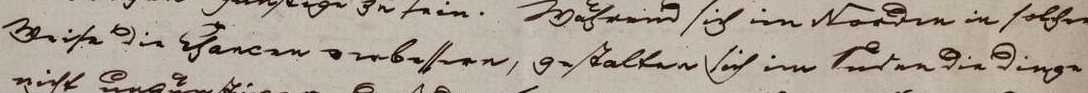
Weise die Chancen verbessern, gestalten sich im Süden die Dinge
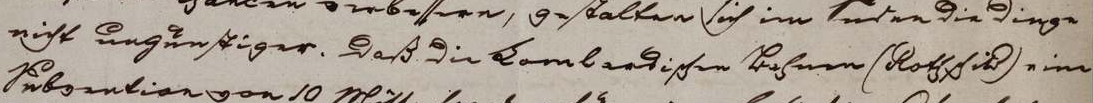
nicht ungünstiger. Daß die Lombardischen Bahnen (Rothschild) eine
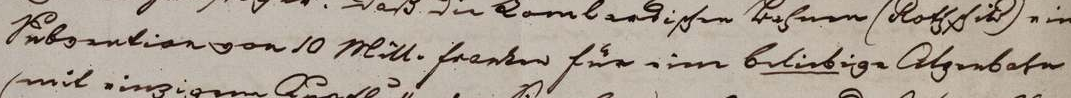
Subvention von 10 Mill. Franken für eine beliebigeAlpenbahn
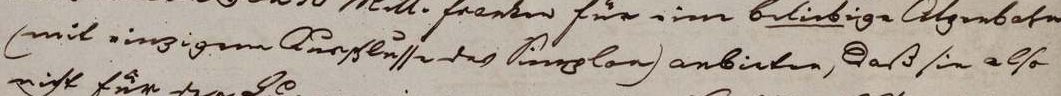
(mit einzigem Ausschlusse des Simplon ) anbieten, daß sie also
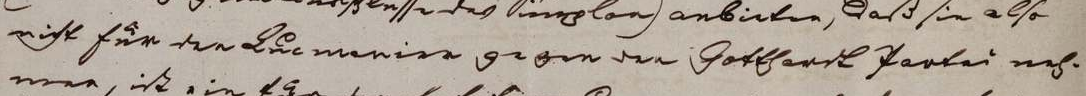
nicht für den Lucmanier gegen den Gotthardt Partei neh-
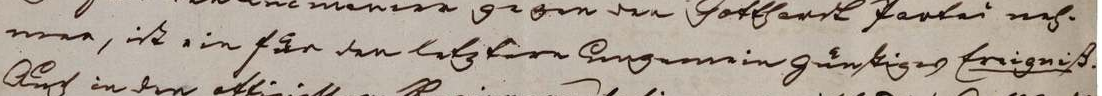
men, ist ein für den letztern ungemein günstiges Ereigniß.
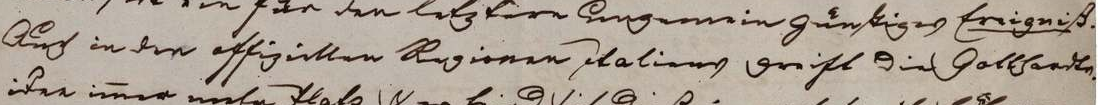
Auch in den offiziellen Regionen Italiens greift die Gotthardts -
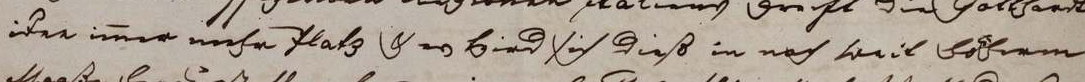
idee immer mehr Platz & es wird sich dieß in noch weit höherm
